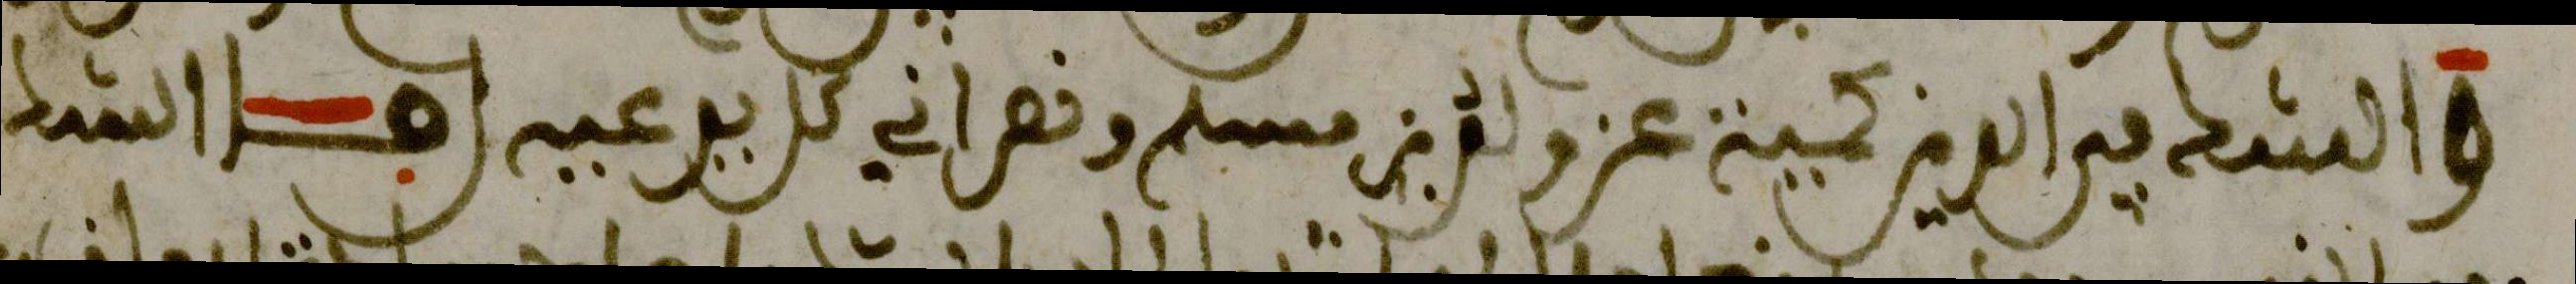الشد في الدين كمية عن ولد بن مسلم ونصراني كل يدعيه ا ما الشد
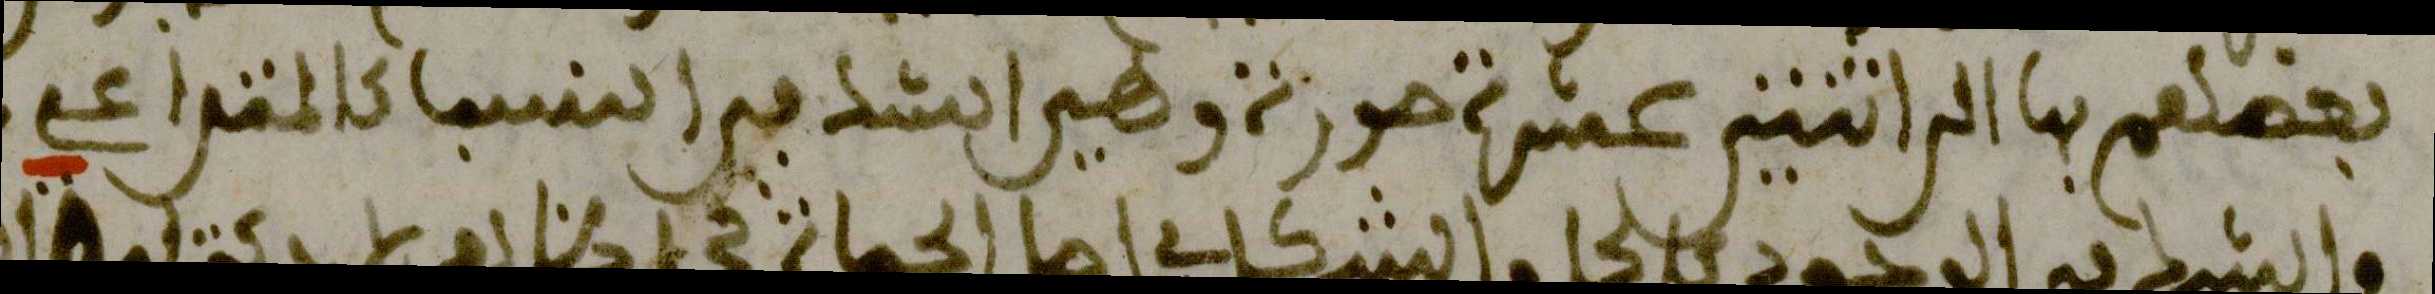بعضهم بها الى اثنتي عشرة صورة و هي الشد في النسب كاالمتداعي
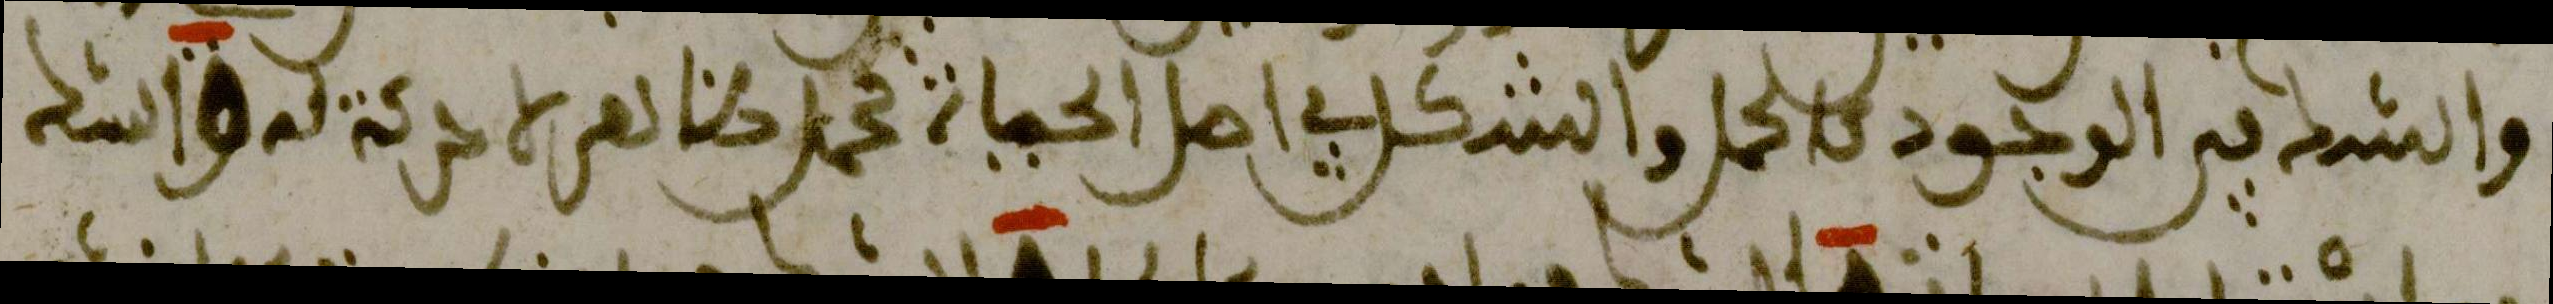والشد في الوجود كالحمل والشكل في اصل الحياة كحمل ظاهر لا حركة له والشد
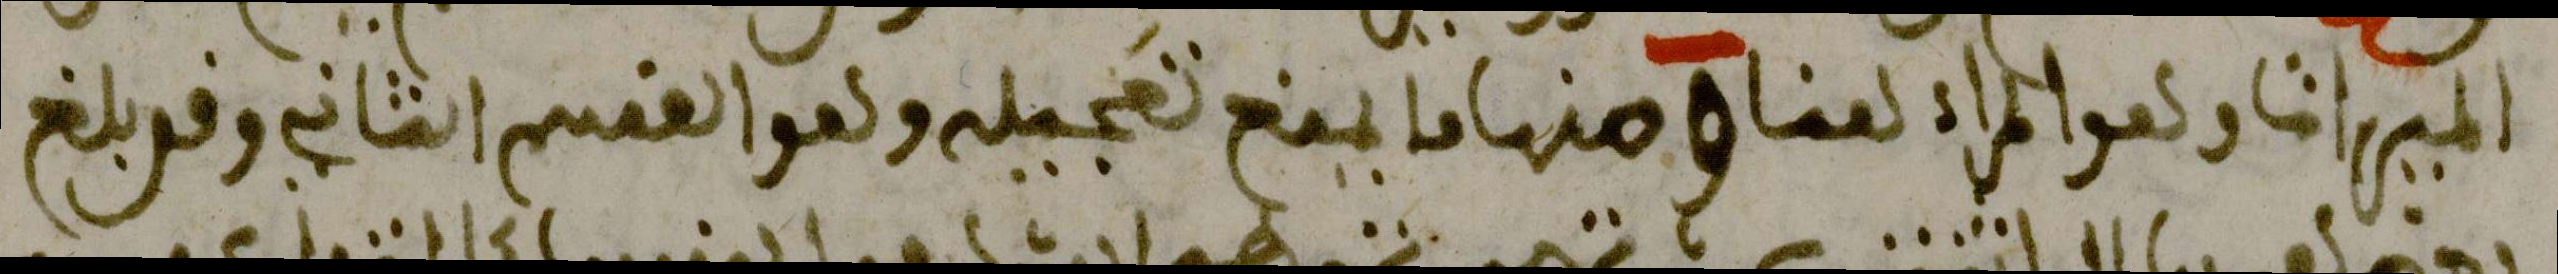الميراث وهو المراد هنا ومنها ما يمنع تعجيله وهو القسم الثاني وقد بلغ
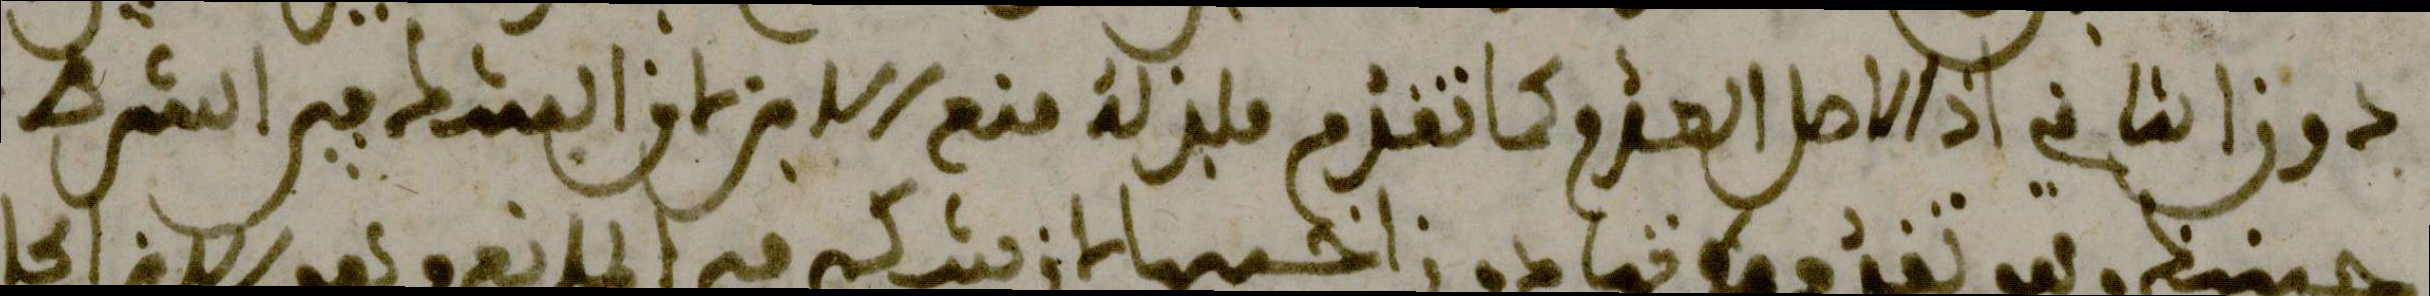دون الثاني اذ الاصل العدم كما تقدم فلذلك منع الابن لان الشد في الشرط
